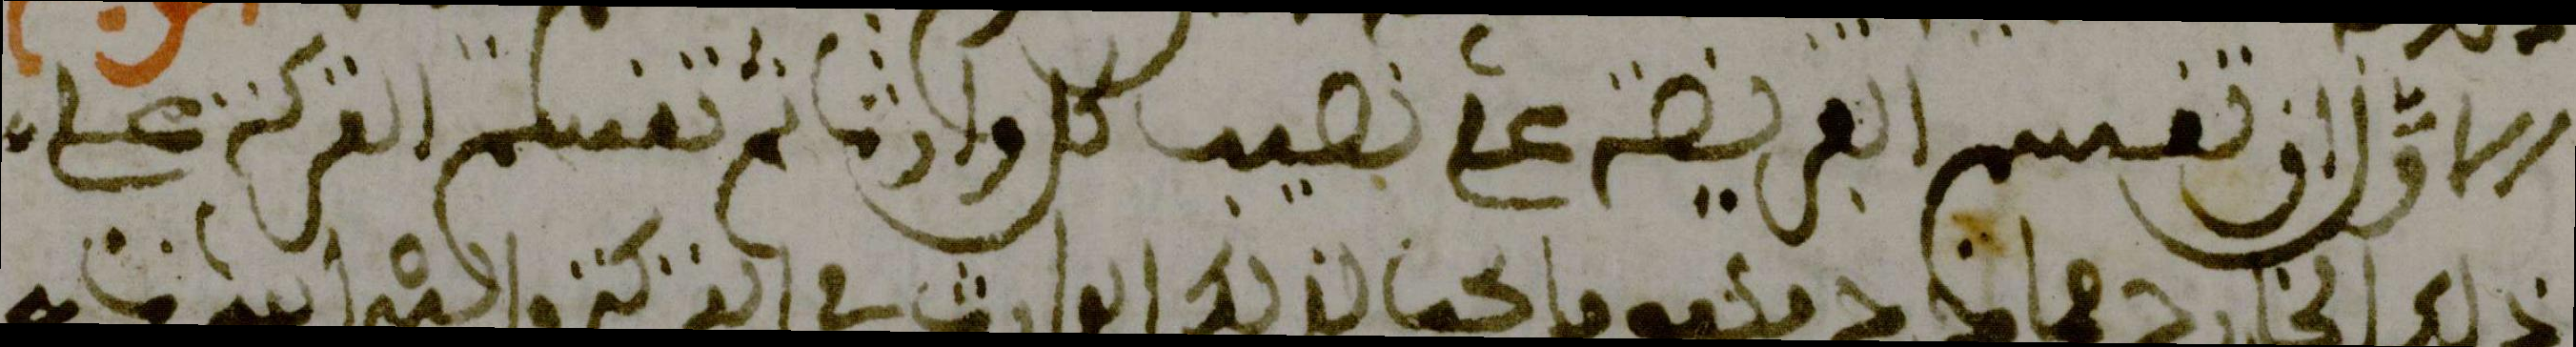الاوَّل ان تقسم الفريضة على نصيب لك وارث ثم تقسم التركة على
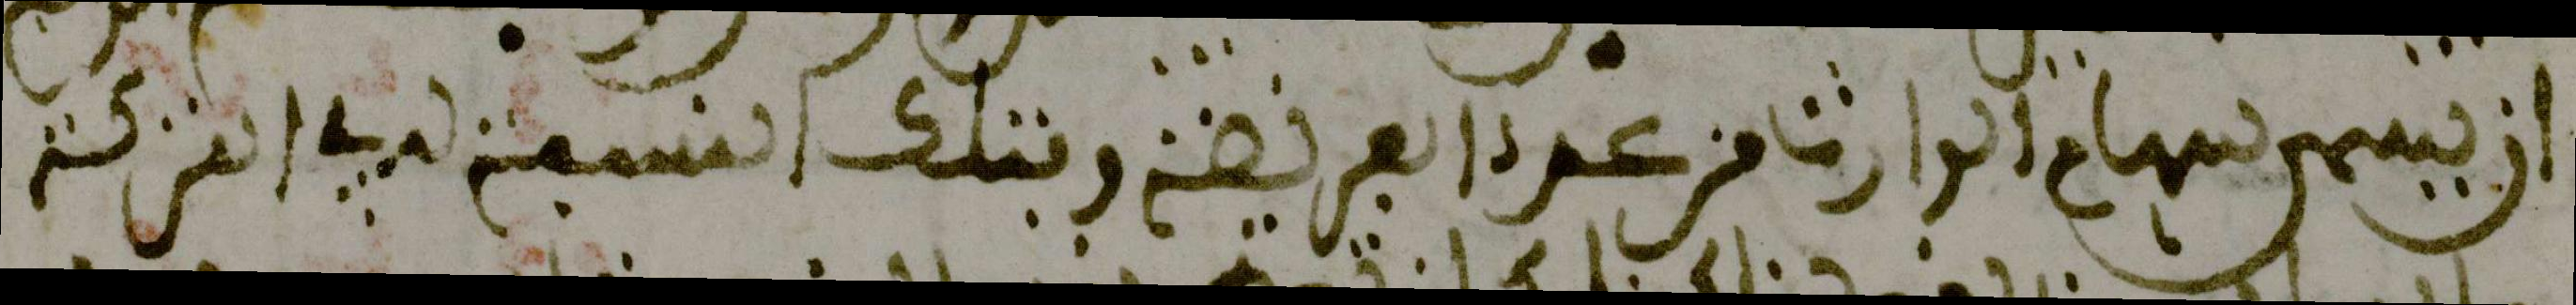ان يسمى سهام الوارث من عدد الفريضة وبتلك النسبة له في التركة
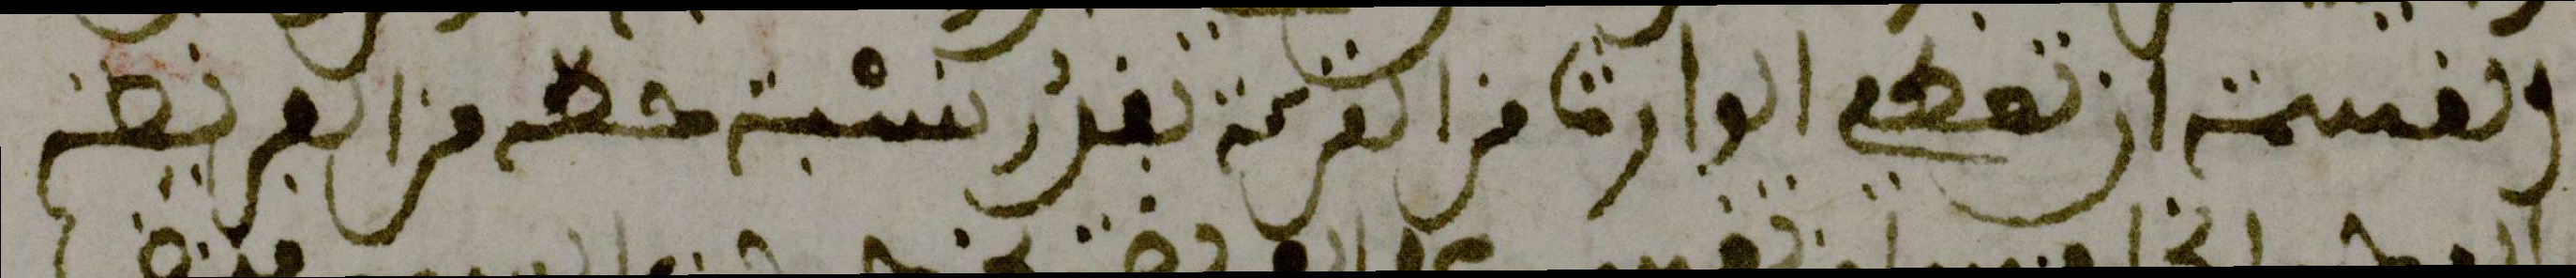القسمة ان تعطي الوارث من التركة بقدر نسْبة حظه من الفريضة
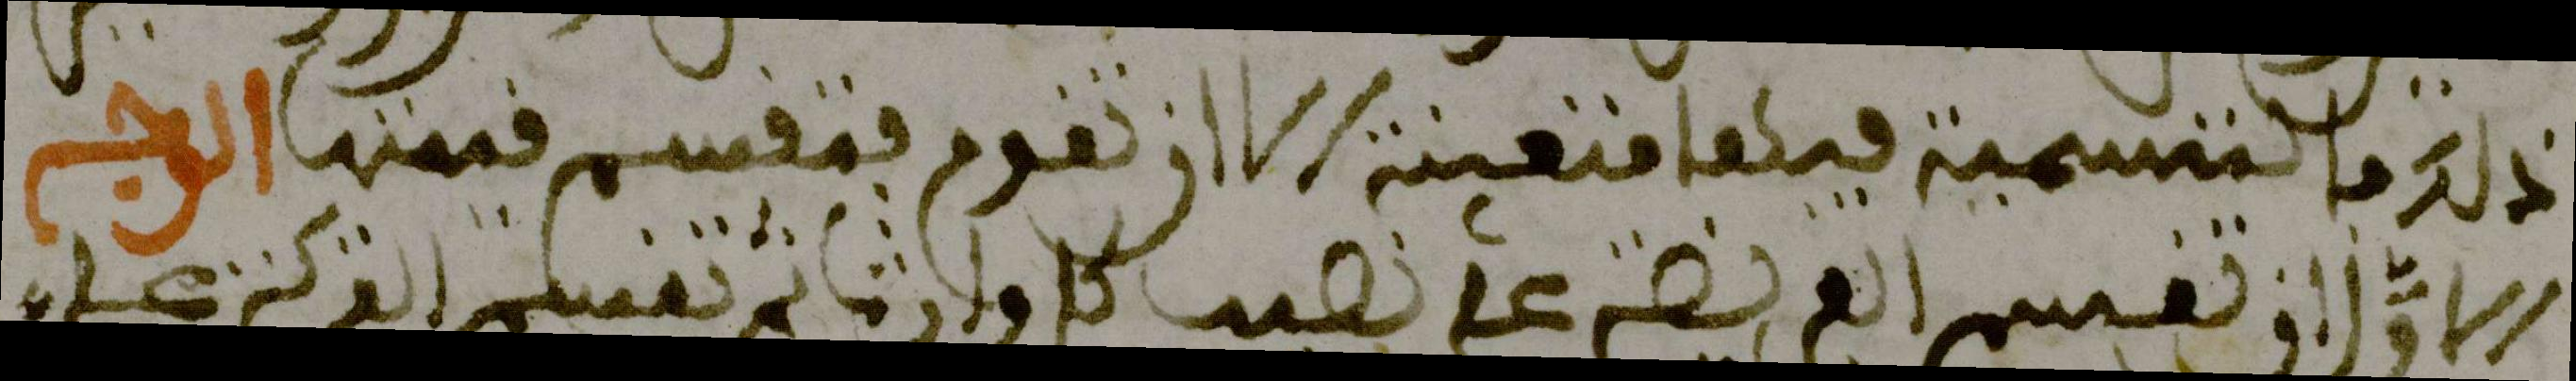ذلك فالتسمية فيها متعينة الا ان تقوم فتقسم قيمتها الوجه
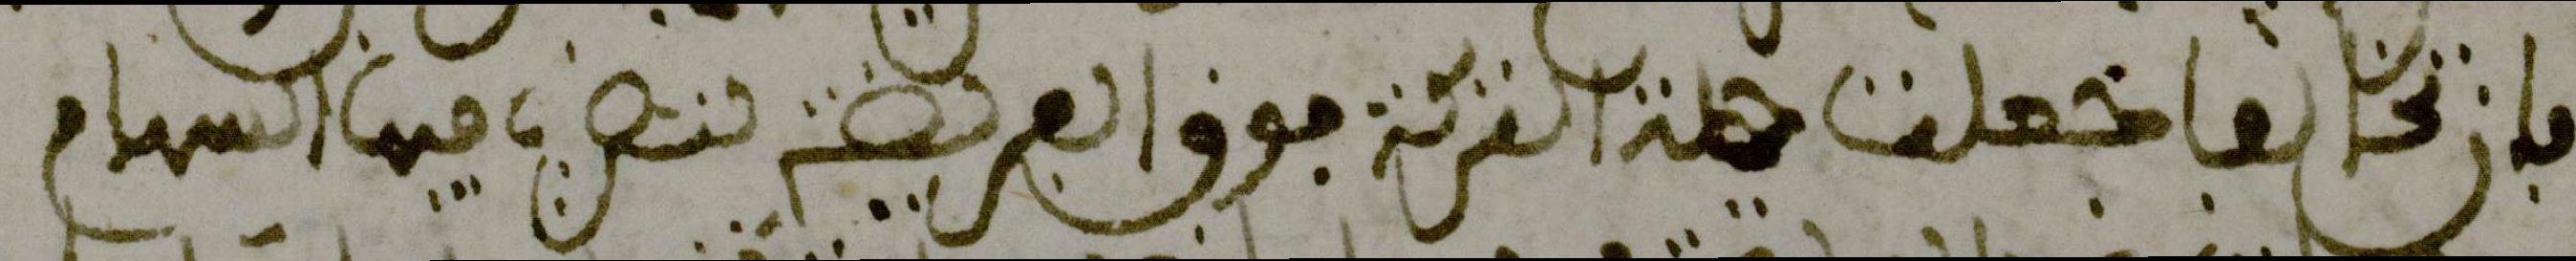فان تخالفا جعلت جملة التركة فوق الفريضة لتضرب فيها السهام
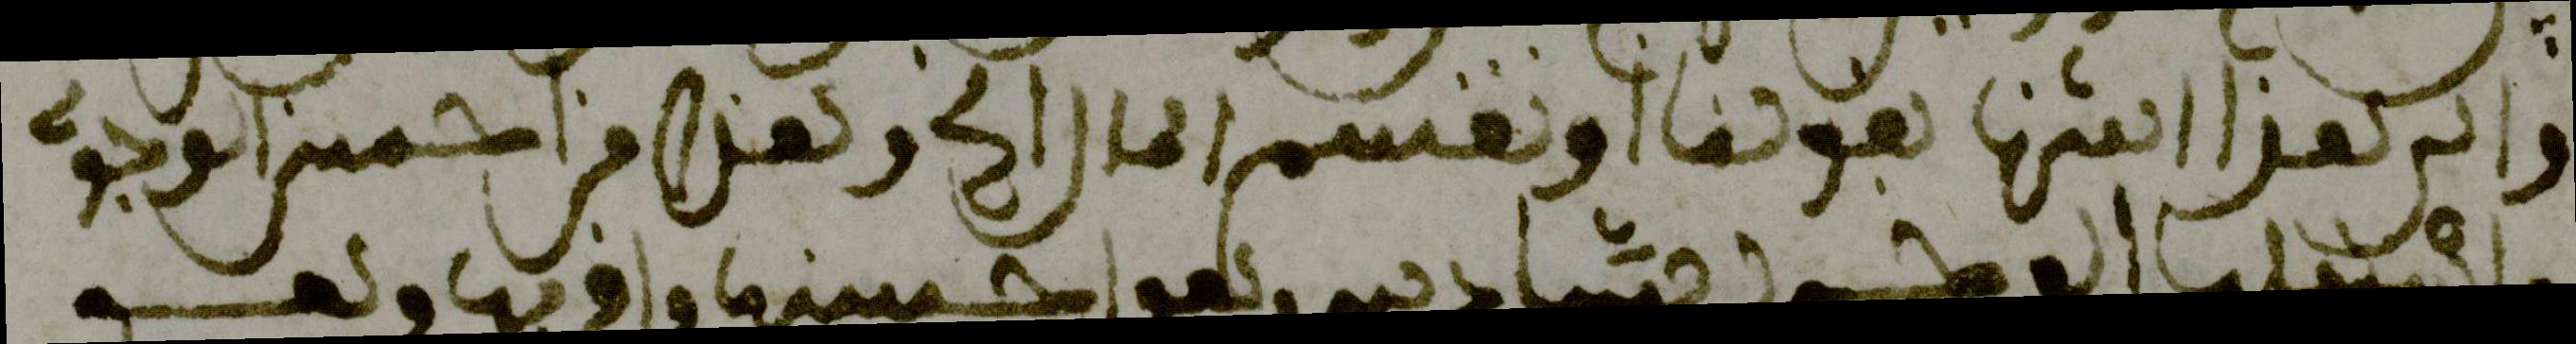والى هذا اشرن بقولنا او تقسم المال الخ وهذا من احسن الوجوه
